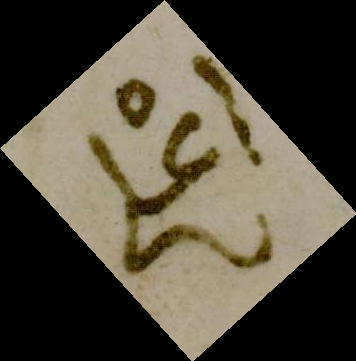اعْلم
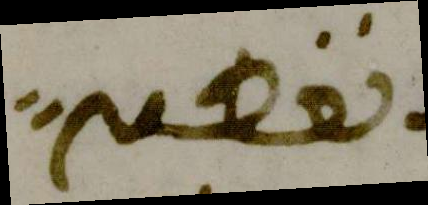تعطيه
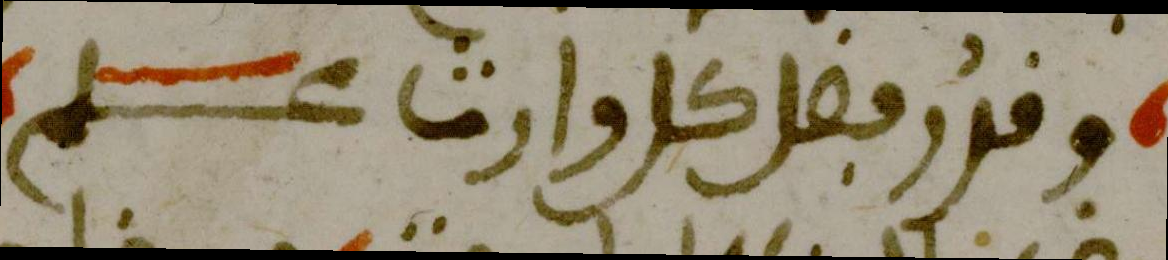وقد فضل كل وارث عَلم
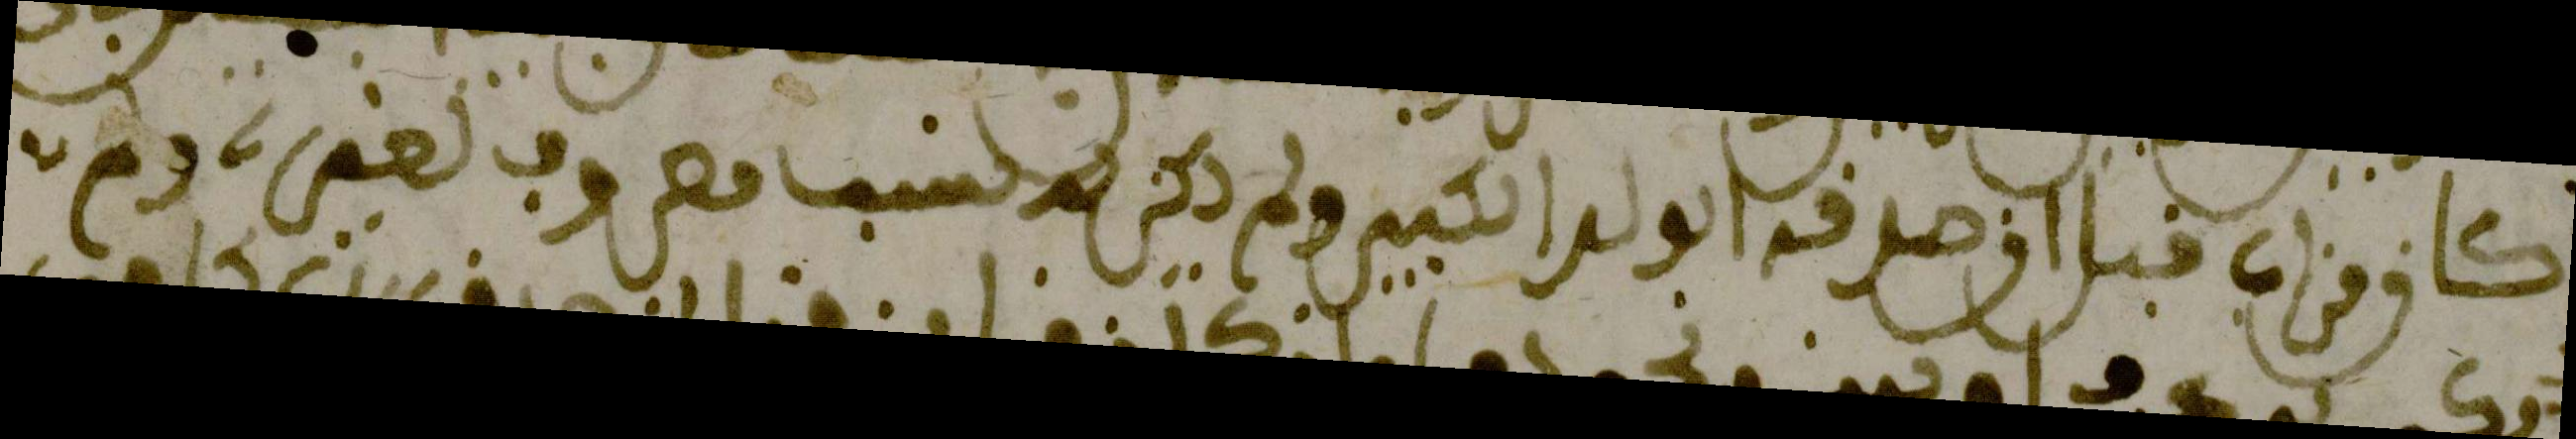كان من اب قبل ان صدقة الولد الكبير ولم يكن له نسب معروف لغيره ولم
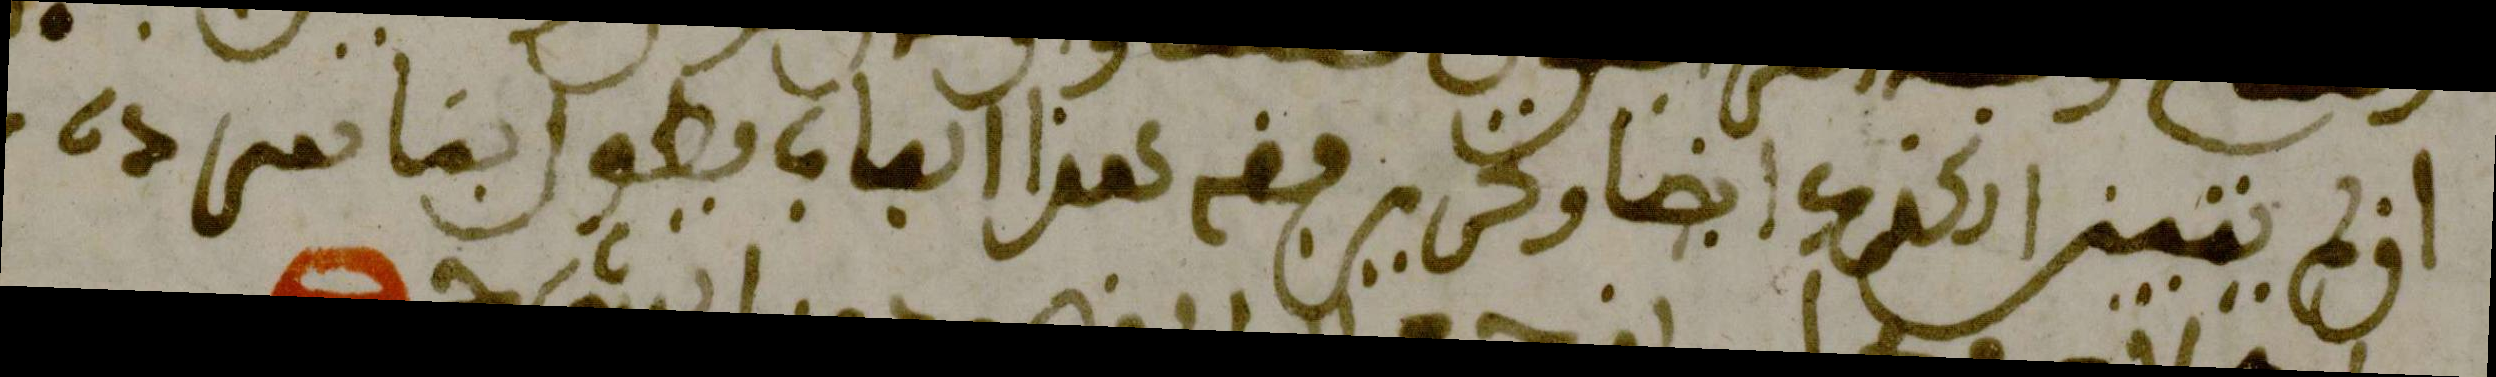ان لم يتبين الكذب ايضا وتحرير فقه هذا الباب يطول بنا سرده
